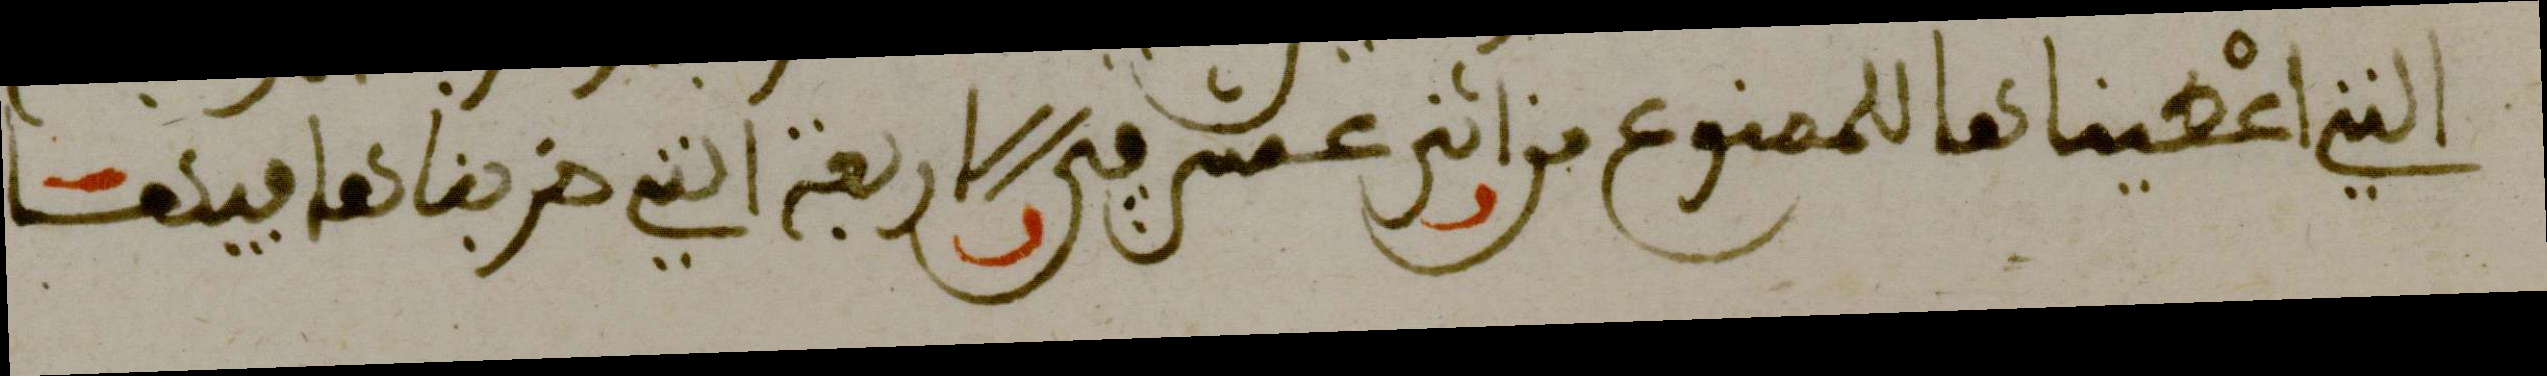التي اعطيناها للممنوع من اثنى عشر في الاربعة التي ضربناها فيها
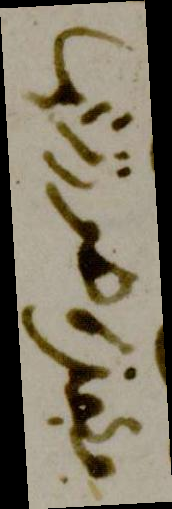فهذه صورتها
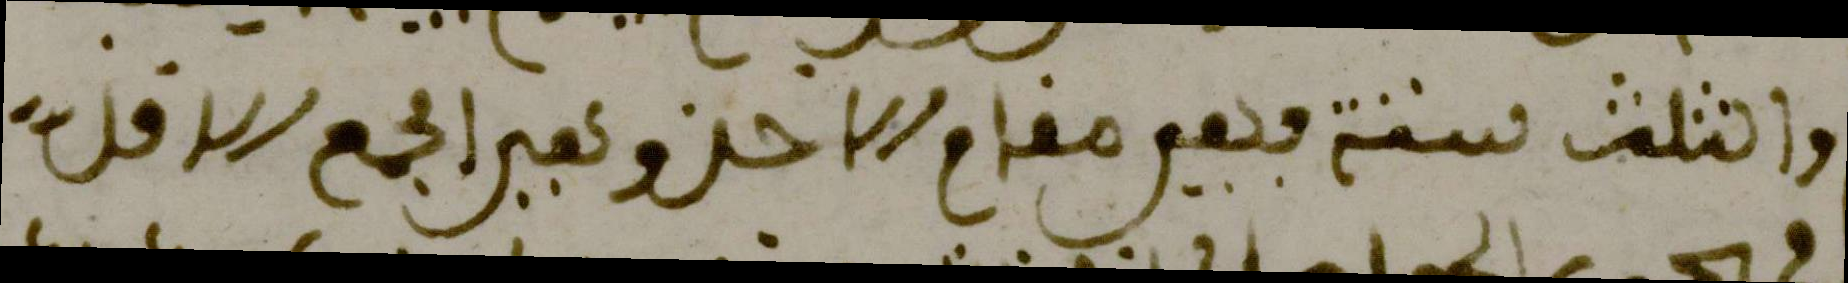والثلث ستة فهي مقام الاخذ وهي الجمع الاقل
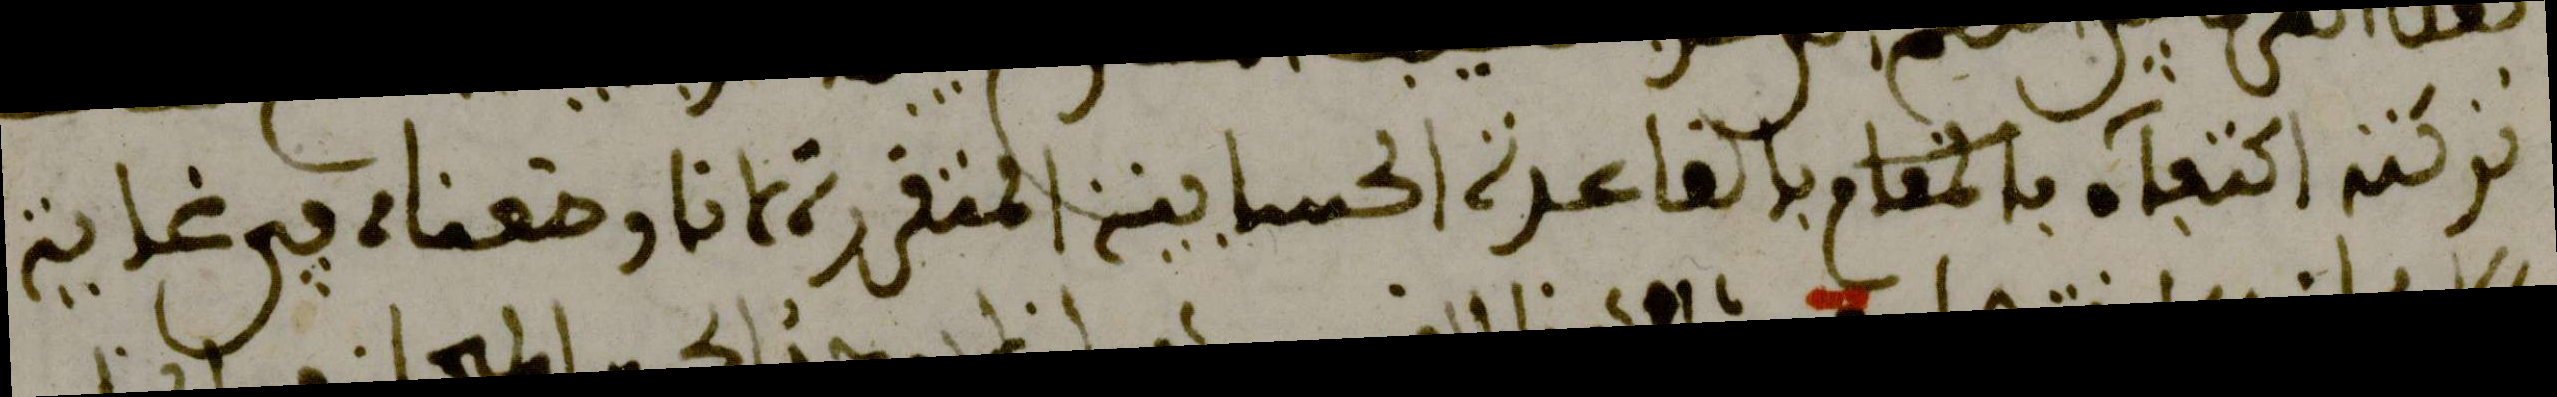تركته اكتفاء بالمقام بالقاعدة الحسابية المتقررة لانا وضعناه في غاية
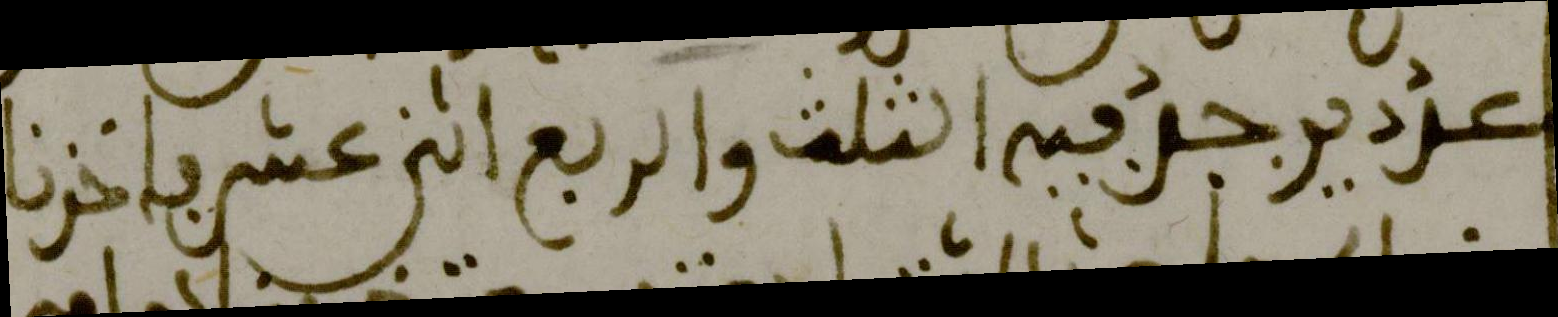عدد يوجد فيه الثلث والربع اثنى عشر فاخذنا
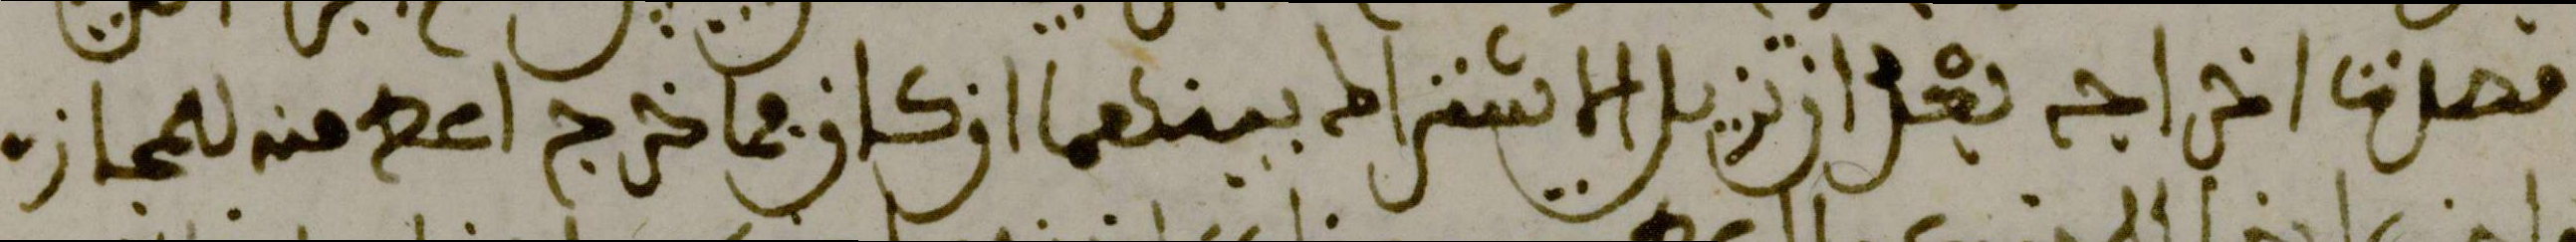قصدت اخرجه بعد ان تزيل الاشتراك بينهما ان كان فما خرج اعط منه للمجاز
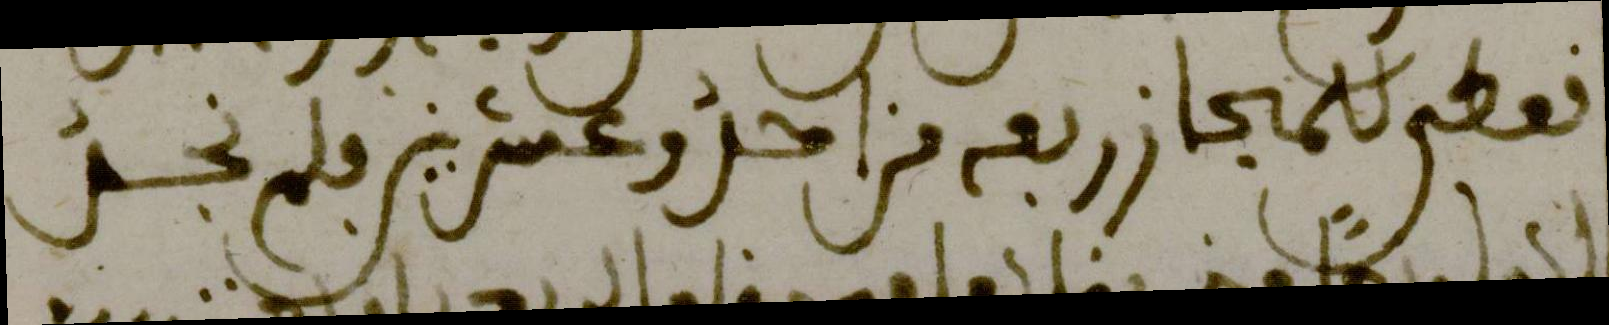نعطى للمجاز ربعه من احد وعشرين فلم نجد
